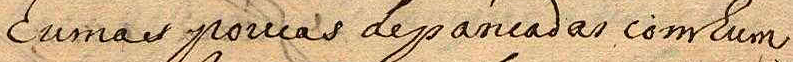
humas poucas de pancadas com hum
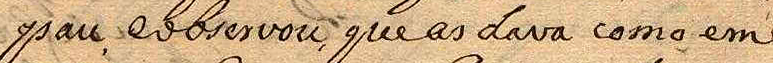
pau, e observou, que as dava como em
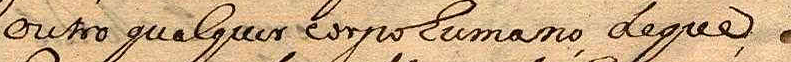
outro qualquer corpo humano, de que,
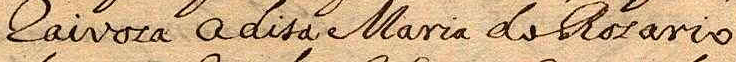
Raivoza a dita Maria do Rozario
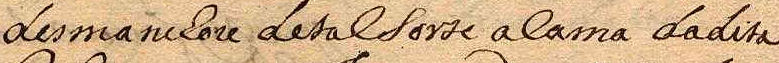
desmanchou de tal sorte a Cama da dita
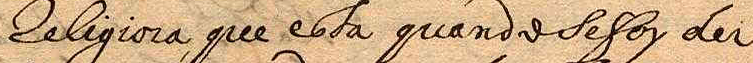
Religioza, que esta quando Se foy dei
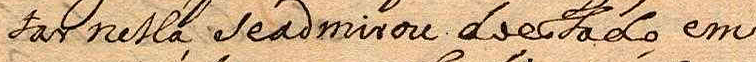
tar nella, se admirou do estado, em
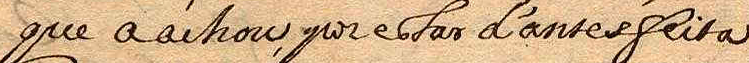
que a achou, por estar d'antes feita.
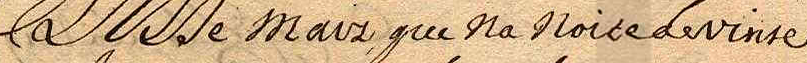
Disse mais, que na noite de vinte
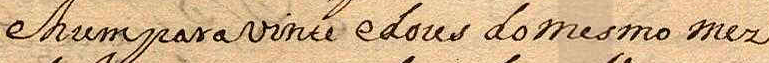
e hum para vinte e dous do mesmo mez
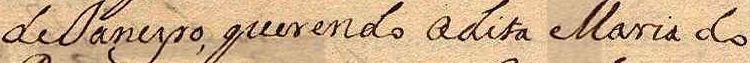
de Ianeyro, querendo a dita Maria do
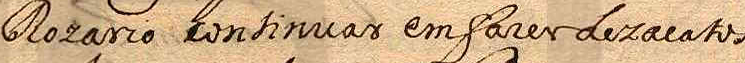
Rozario continuar em fazer dezacatos
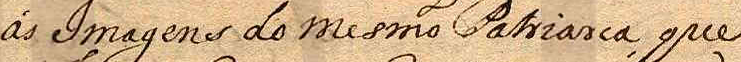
ás Imagens do mesmo Patriarca, que
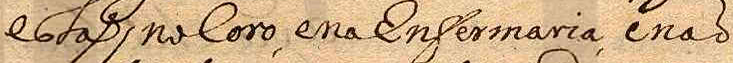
estaõ no Coro, e na Enfermaria, e naõ
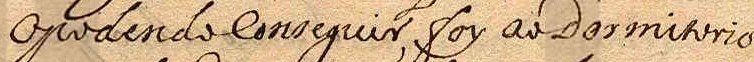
o podendo conseguir, foy ao Dormitorio
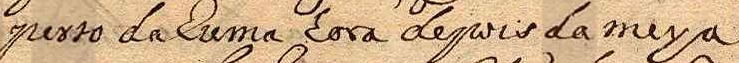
perto da huma hora depois da meya
